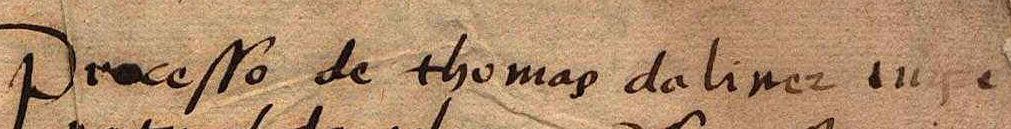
Processo de thomas daliner ingre
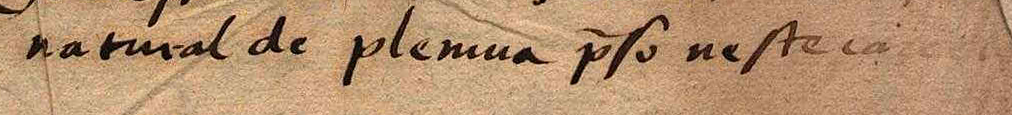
natural de plemua p̄so neste carcere
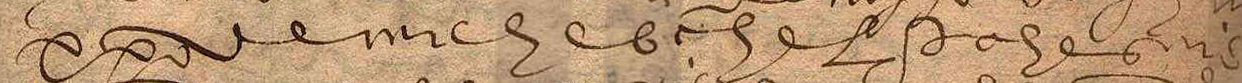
xp̄o de mil he bc he Lta he seis
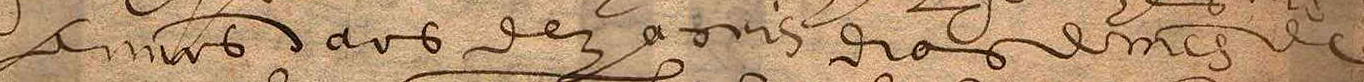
ann̄os aos dezaseis dias do mēs de
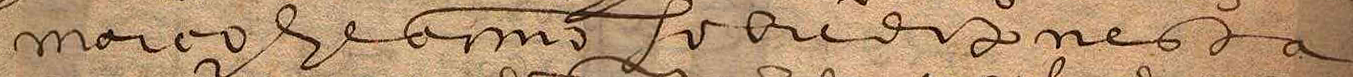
março he anno sobredito nesta
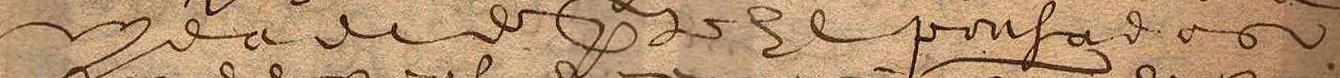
cydade do p̄to he pousadas
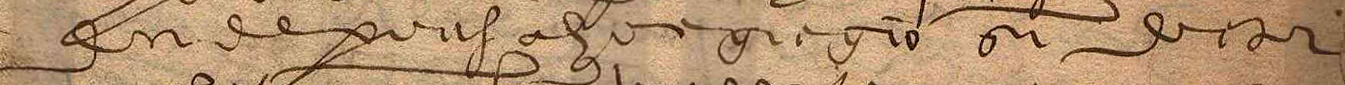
donde pousa ho egregio s̄or doctor
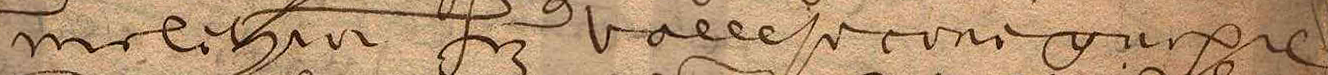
melchior frz̄ vallejo coneguo pre
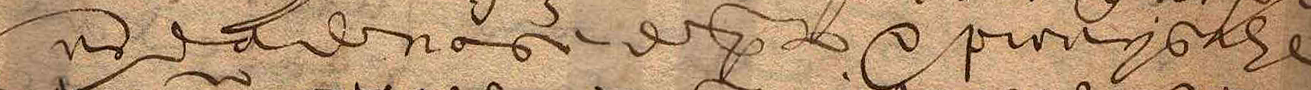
uēdado na se do p̄to e prouysor he
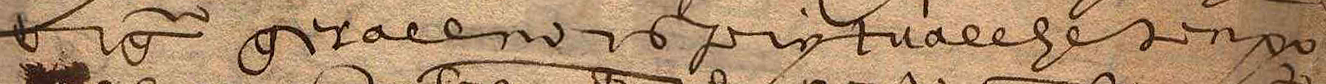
vigro gerall no esprytuall he tenpo
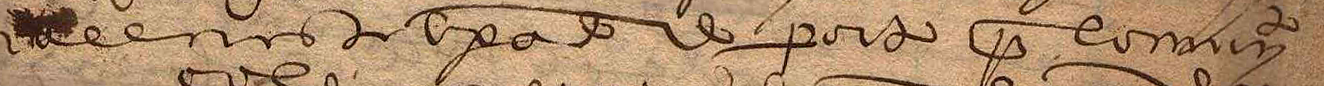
rall neste b̄pado do porto p̄lo muyto
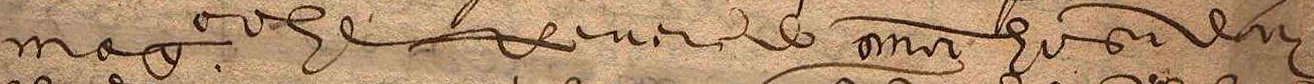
magco he Reuerēdo s̄enor ho s̄or dom
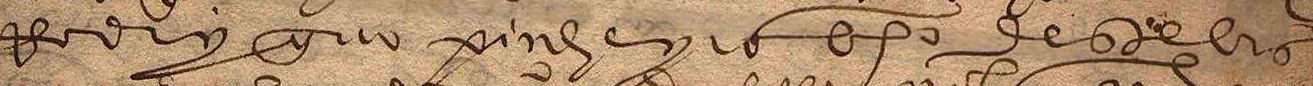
Rodryguo pinheyro b̄po deste bis
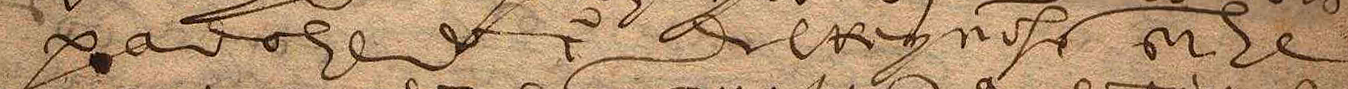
pado he do co del Rey noso s̄or he
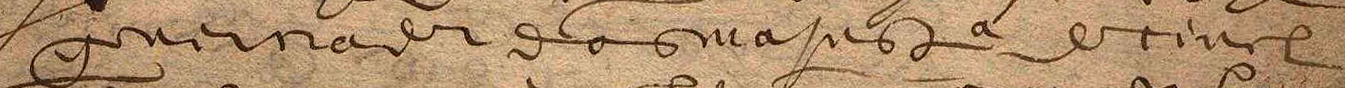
gouernador da sua justa do ciuel
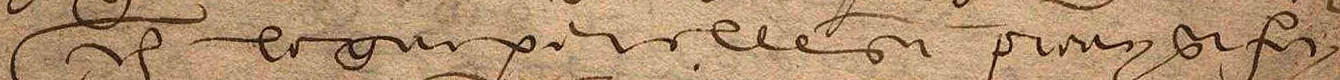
c̄ꝭ loguo por elle s̄or prouysor foy
